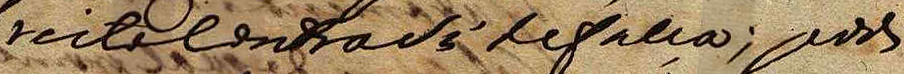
reito, contra Si de falça; por
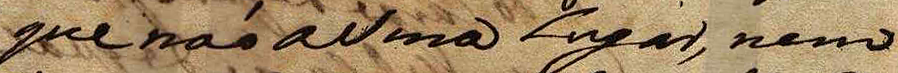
que naõ asina Lugar, nem
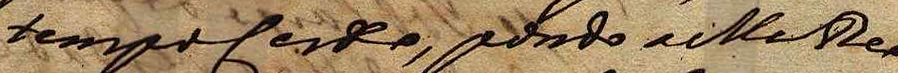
tempo Certo, pondo a elle Reo
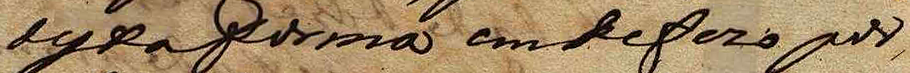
desta forma emdefezo por
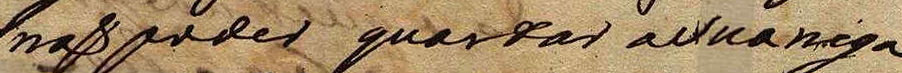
naõ poder quartar a sua nega
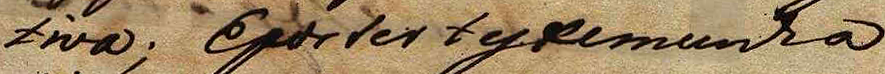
tiva; E por ser testemunha
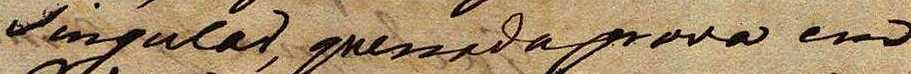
singular, que nada prova em
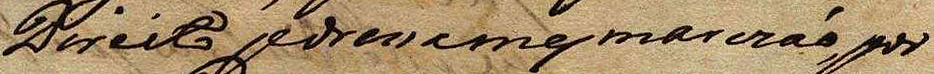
Direito porem a mesma rezaõ, por
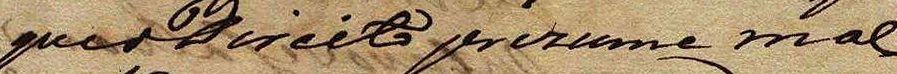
que o Direito prezume mal
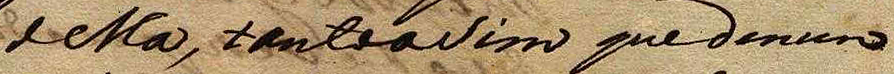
della, tanto assim que denun
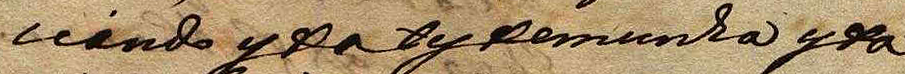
ciando esta testemunha esta
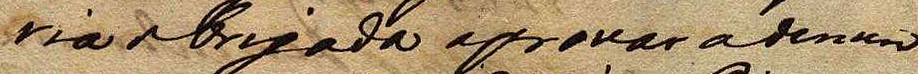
ria obrigada a provar a denun
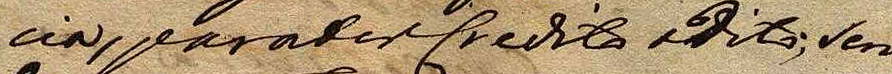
cia, para ter Credito o disto; sen
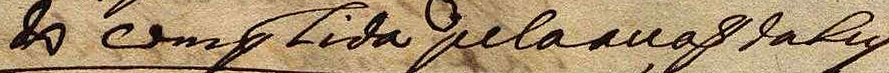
do complida pela açaõ da Ley
